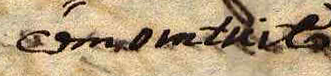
com o intuito.
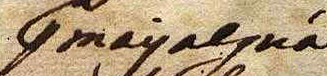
p.a mais alguā
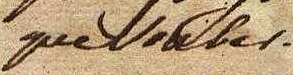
que souber.
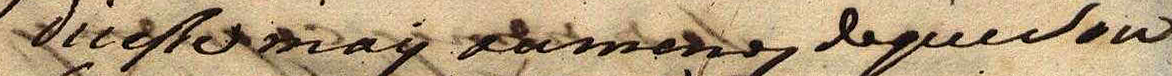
dicesse mais ou menos do que sou
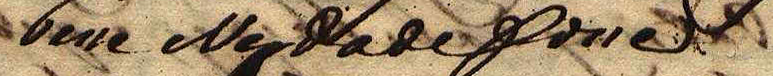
besse e verdade fosse
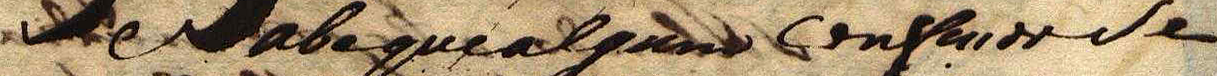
Se Sabe que algum confessor se
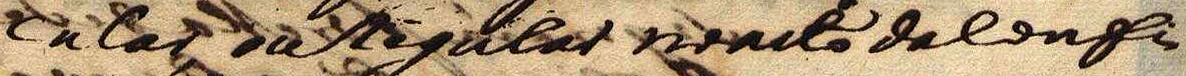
cular, ou Regular no acto da confi
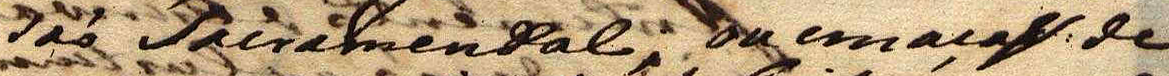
saõ sacramental, ou em açaõ de
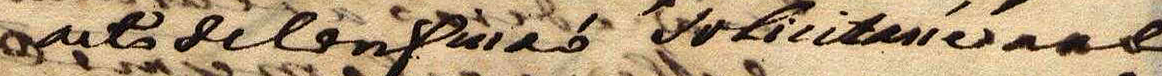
acto de confissaõ solicitasse a al
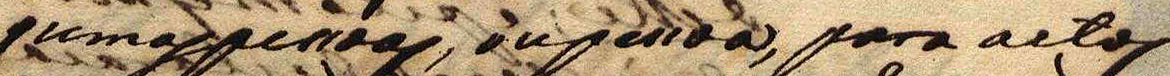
algumas pessoas, ou pessoa, para actos
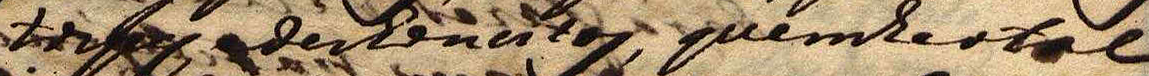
torpes, e deshonestos, quem he o tal
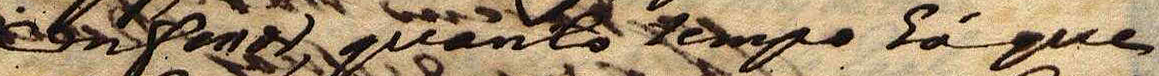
confessor, quanto tempo há que
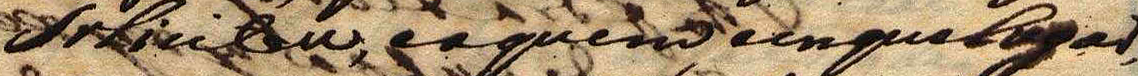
solicitou, e a quem, e em que lugar,
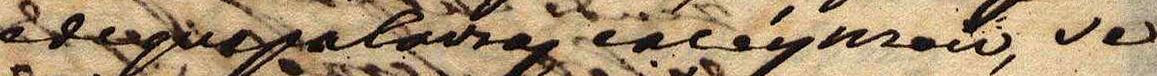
e de que palavras, e ações uzou, se
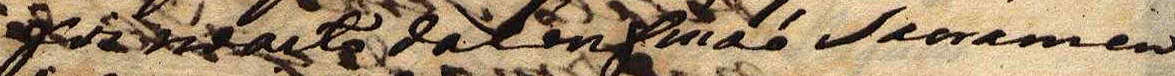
foi no acto da confissaõ sacramen
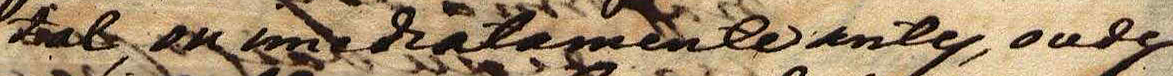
tal, ou imediatamente antes, ou des
